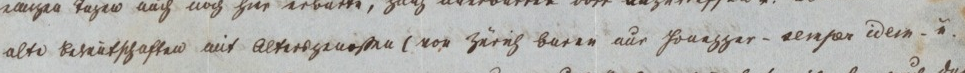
alte Bekanntschaften mit Altersgenossen (von Zürich waren nur Honegger – semper idem – u.
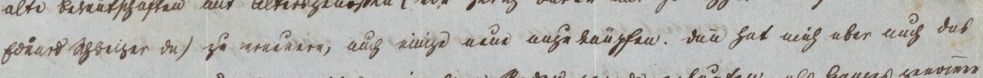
Eduard Schweizer da) zu erneuern, auch einige neue anzuknüpfen. Dann hat mich aber auch das
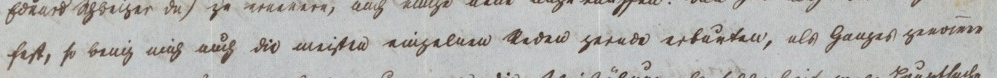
Fest, so wenig mich auch die meisten einzelnen Reden gerade erbauten, als Ganzes genommen
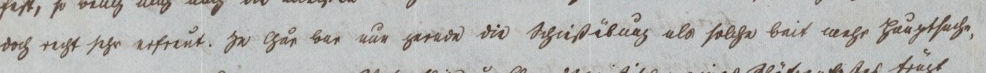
doch recht sehr erfreut. In Chur war nun gerade die Schießübung als solche weit mehr Hauptsache,
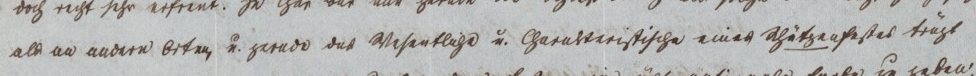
als an andern Orten, u. gerade das Wesentliche u. Charakteristische eines Schützenfestes trägt
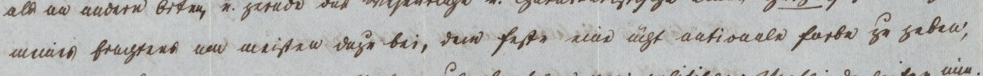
meines Erachtens am meisten dazu bei, dem Feste eine ächt nationale Farbe zu geben,
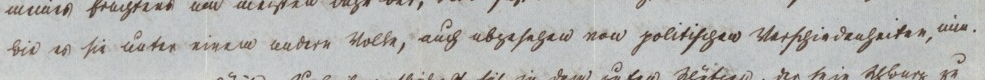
wie es sie unter einem andern Volke, auch abgesehen von politischen Verschiedenheiten, nim-
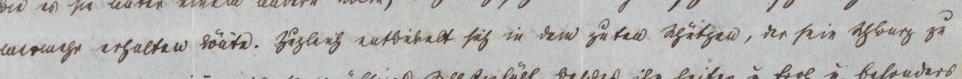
mermehr erhalten könnte. Zugleich entwickelt sich in dem guten Schützen, der sein Schwarz zu
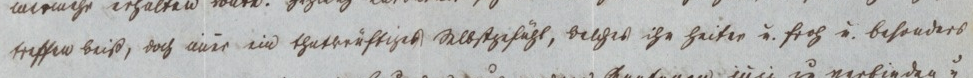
treffen weiß, doch immer ein thatkräftiges Selbstgefühl, welches ihn heiter u. froh u. besonders
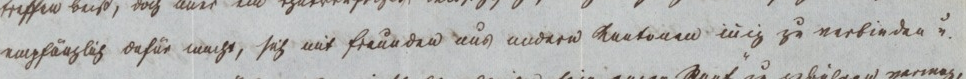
empfänglich dafür macht, sich mit Freunden aus andern Kantonen innig zu verbinden u.
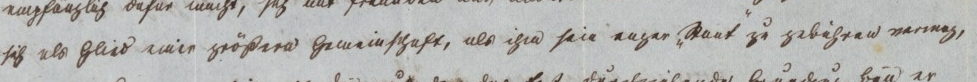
sich als Glied einer größern Gemeinschaft, als ihm sein enger «Staat» zu gewähren vermag,
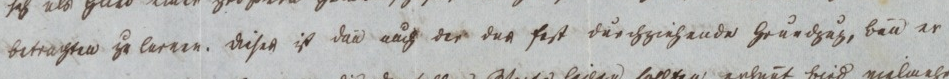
betrachten zu lernen. Dieses ist dann auch der das Fest durchziehende Grundzug, wenn er
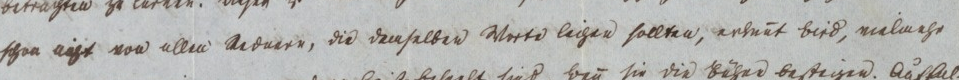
schon nicht von allen Rednern, die demselben Worte leihen sollten, erkannt wird, vielmehr
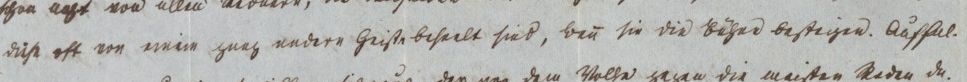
diese oft von einem ganz andern Geiste beseelt sind, wenn sie die Bühne besteigen. Auffal-
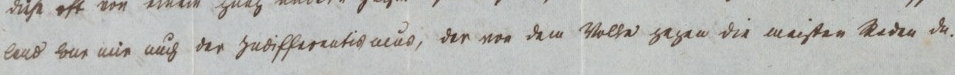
lend war mir auch der Indifferentismus, der von dem Volke gegen die meisten Reden da-
